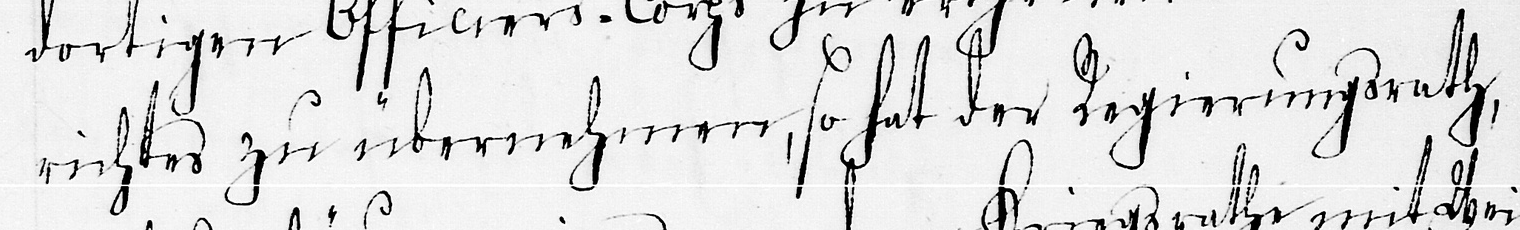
richtes zu übernehmen, so hat der Regierungsrath,
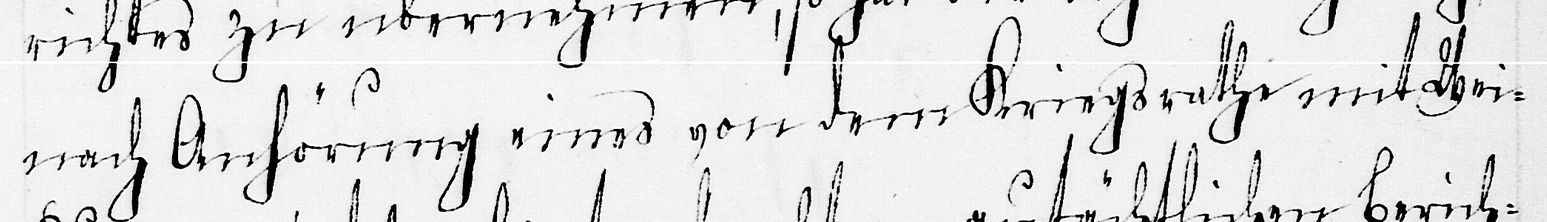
nach Anhörung eines von dem Kriegsrathe mit Wei¬
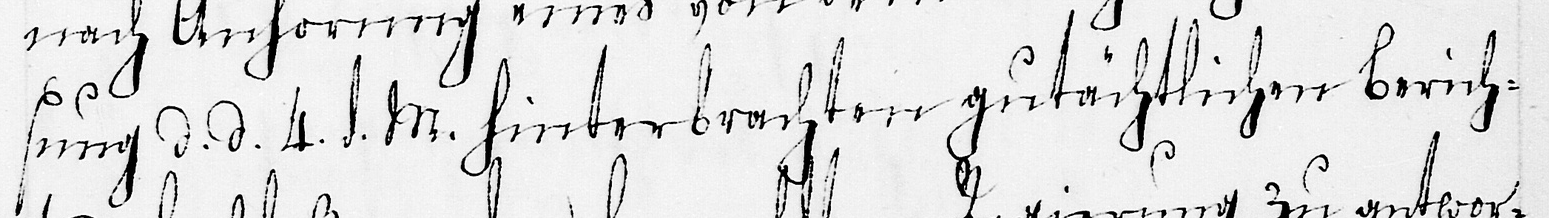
sung d. d. 4. d. M. hinterbrachten gutächtlichen Berich¬
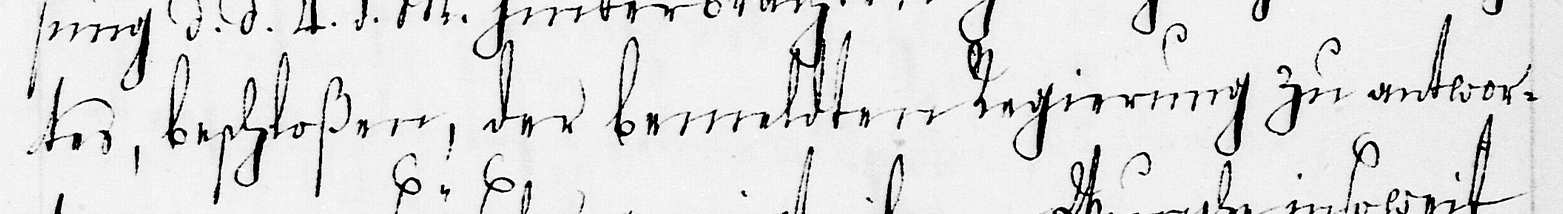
tes, beschloßen, der bemeldten Regierung zu antwor¬
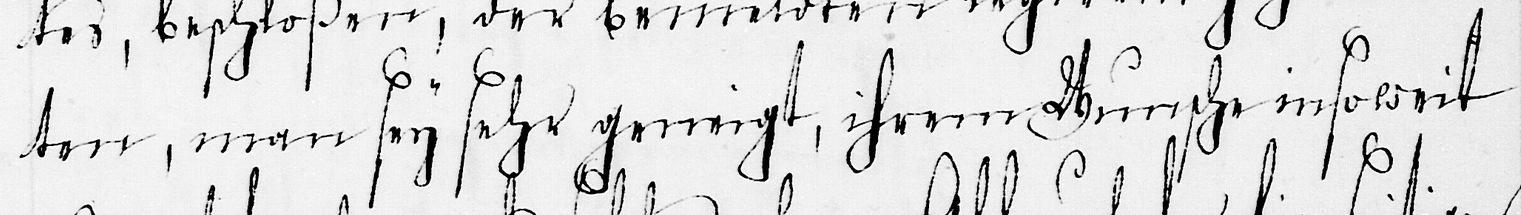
ten, man sey sehr geneigt, ihrem Wunsche insoweit
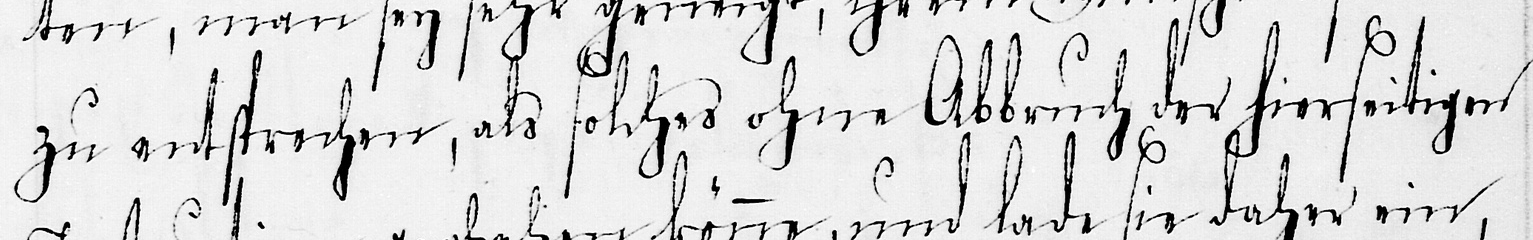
zu entsprechen, als solches ohne Abbruch der hierseitigen
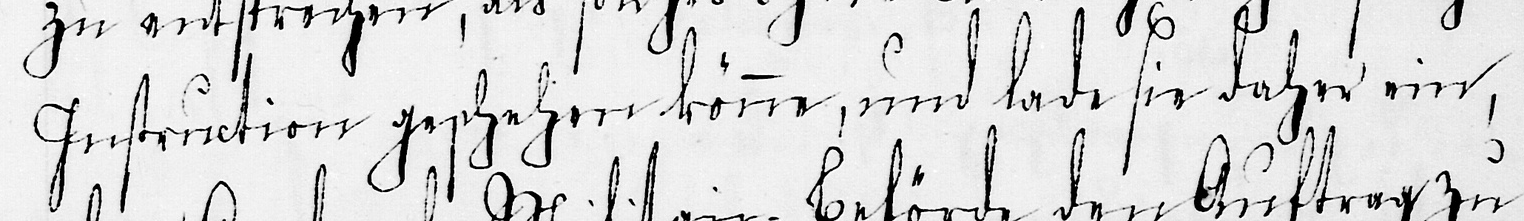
Instruction geschehen könne, und lade sie daher ein,
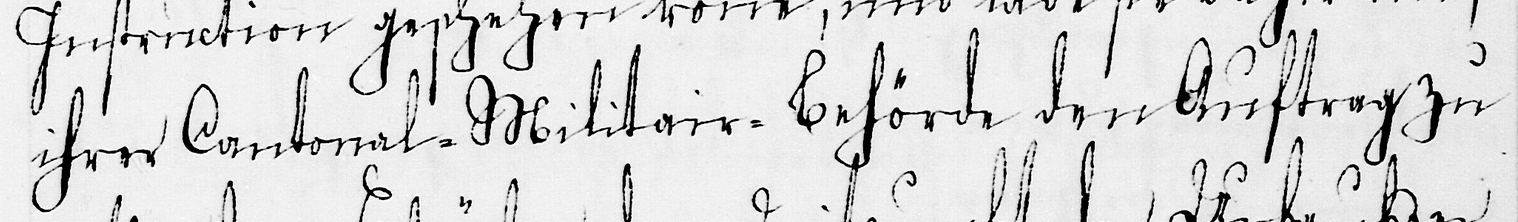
ihrer Cantonal-Militair-Behörde den Auftrag zu
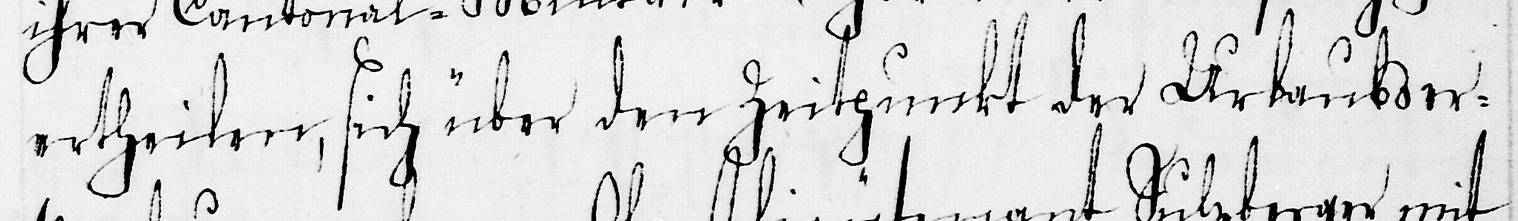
ertheilen, sich über den Zeitpunkt der Urlaubser¬
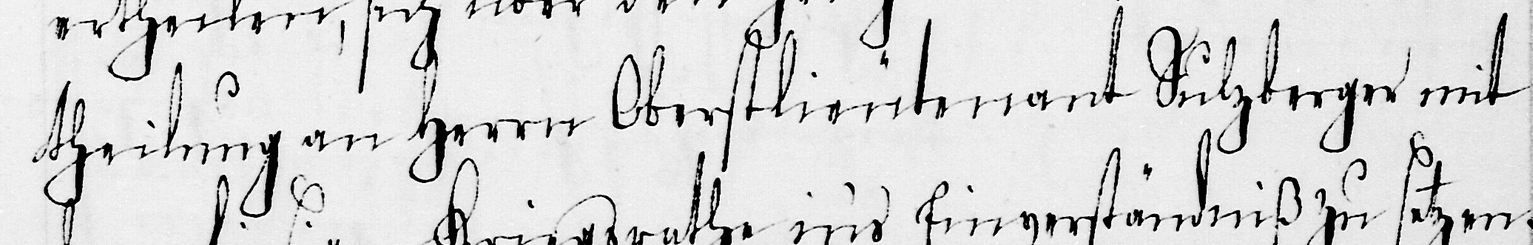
theilung an Herrn Oberstlieutenant Sulzberger mit
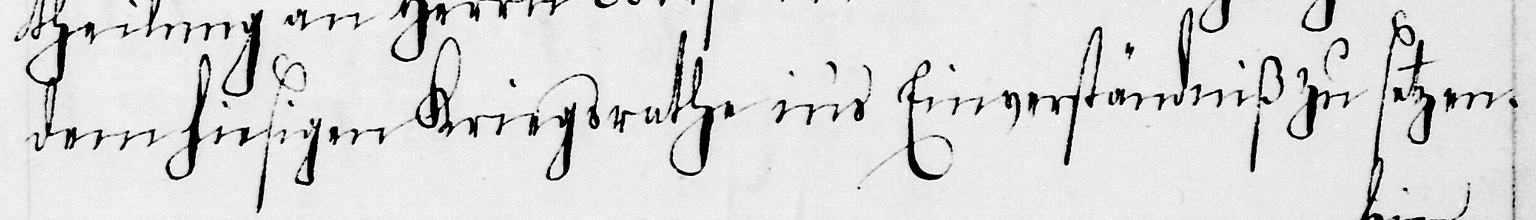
dem hiesigen Kriegsrathe in’s Einverständniß zu setzen.
